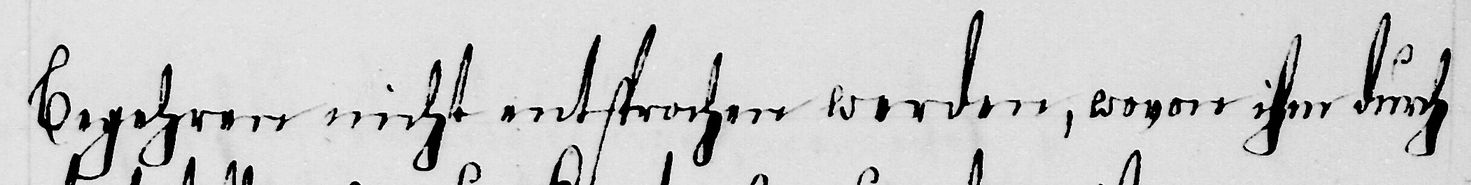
Begehren nicht entsprochen werden, wovon ihm durch
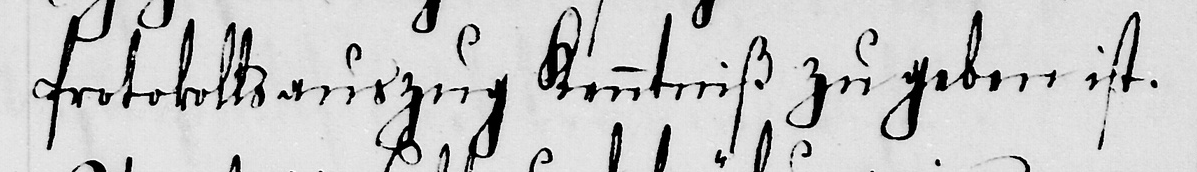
Protokollsauszug Kenntniß zu geben ist.
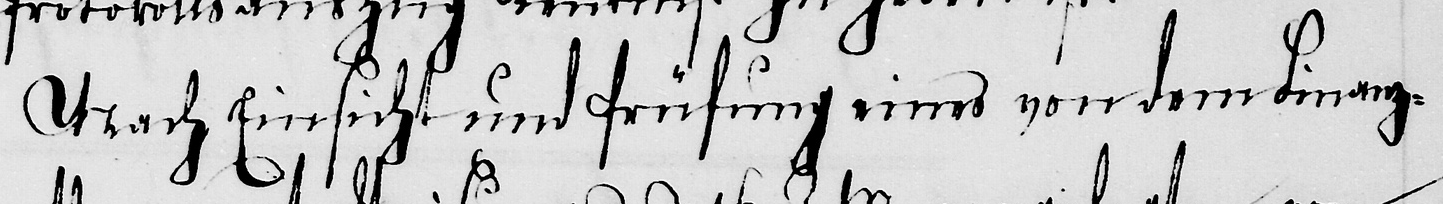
Nach Einsicht und Prüfung eines von dem Finanz¬
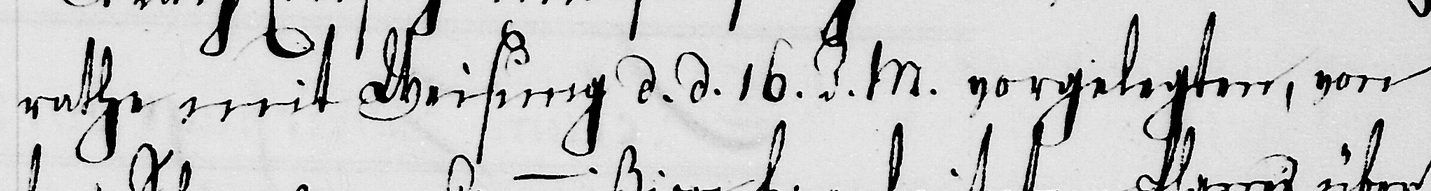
rathe mit Weisung d.d. 16. d. M. vorgelegten, von
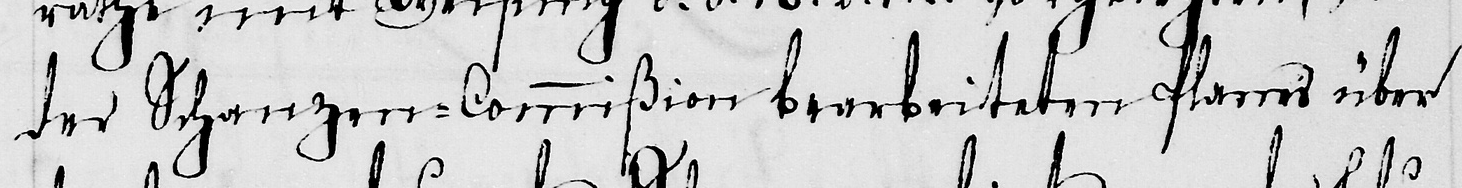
der Schanzen-Commißion bearbeiteten Planes über
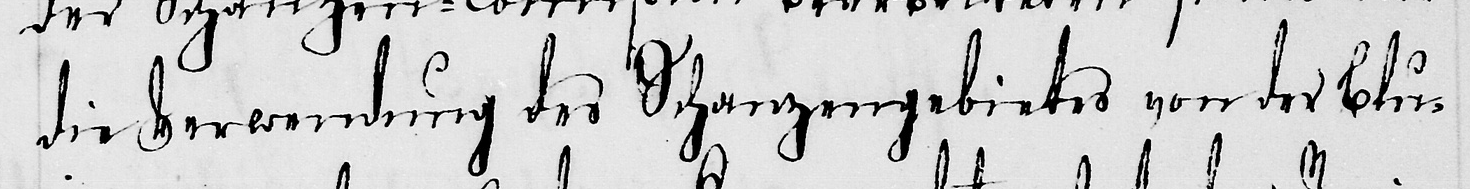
die Verwendung des Schanzengebietes von der Blu¬
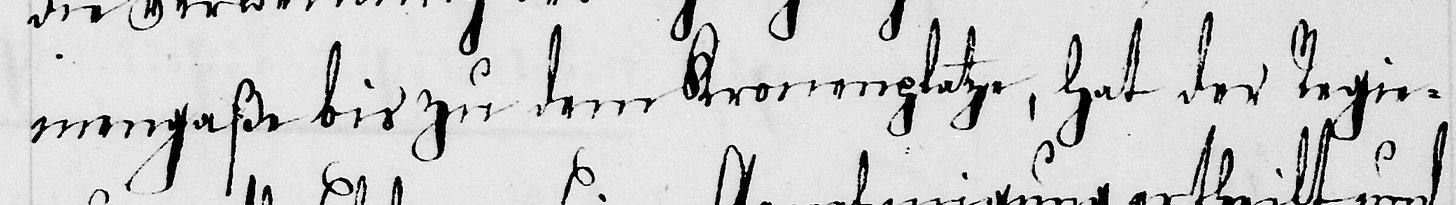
mengaße bis zu dem Kronenplatze, hat der Regie¬
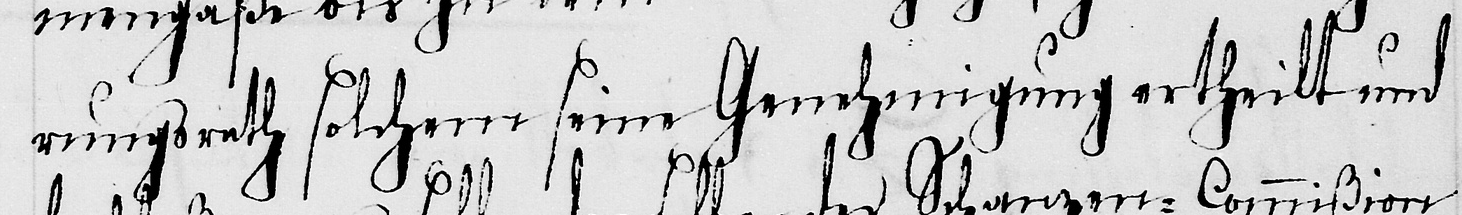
rungsrath solchem seine Genehmigung ertheilt und
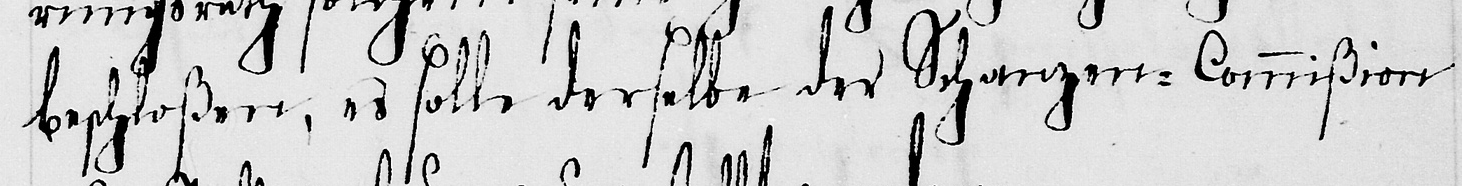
beschloßen, es solle derselbe der Schanzen-Commißion
